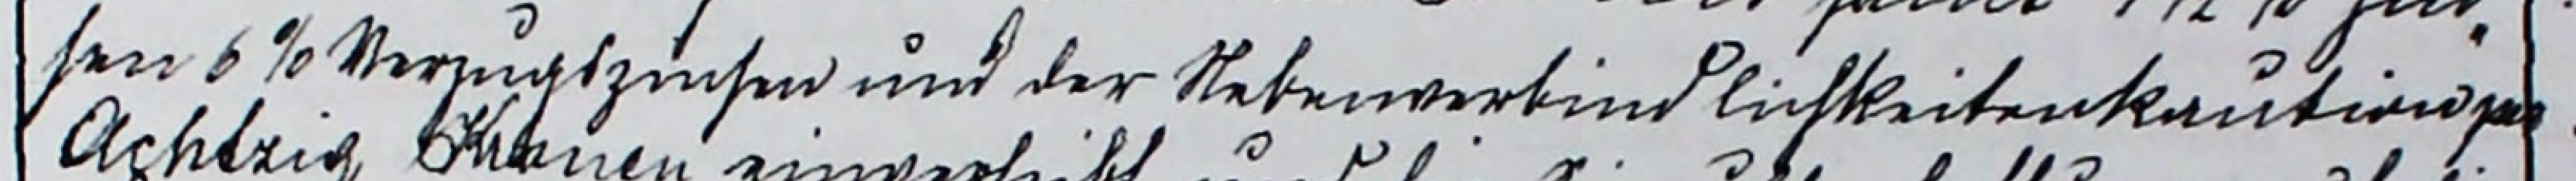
sen 6 % Verzugszinsen und der Nebenverbindlichkeitenkaution per
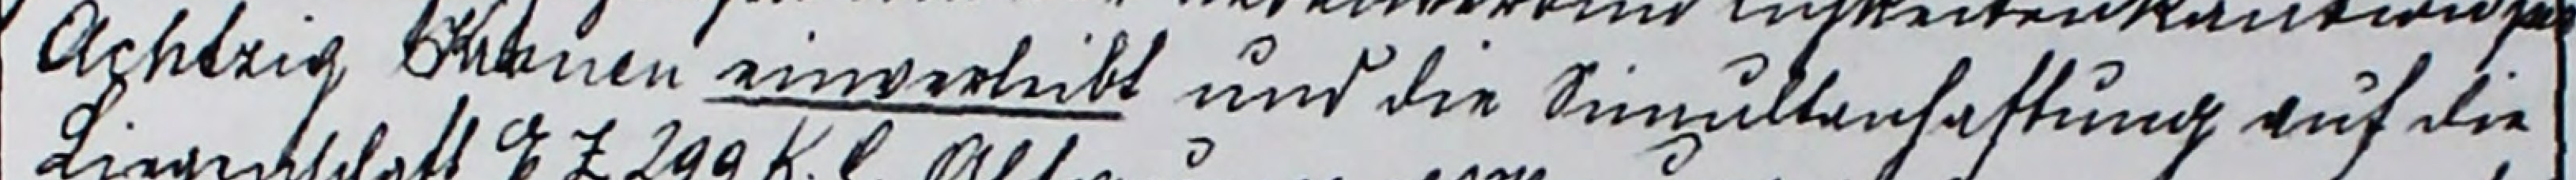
Achtzig Kronen einverleibt und die Simultanhaftung auf die
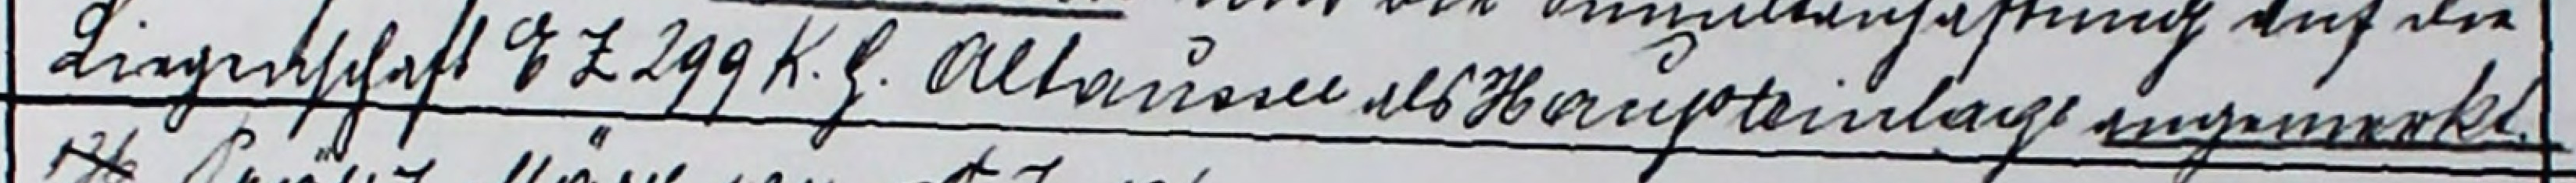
Liegenschaft E Z 299 K.G. Altaussee als Haupteinlage angemerkt.
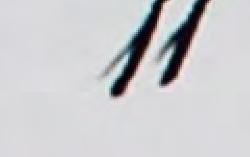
11
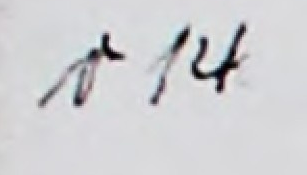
s 14
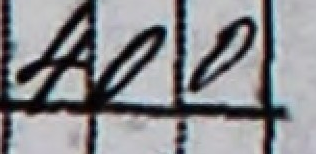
400
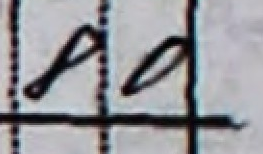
80
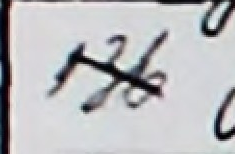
136
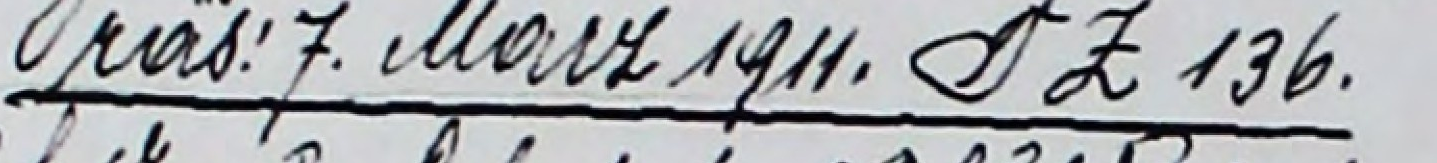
Präs: 7. März 1911. T Z 136.
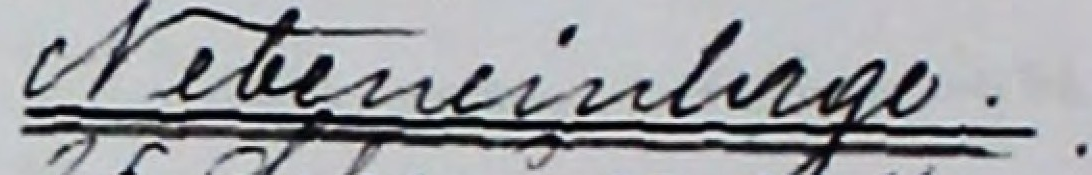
Nebeneinlage
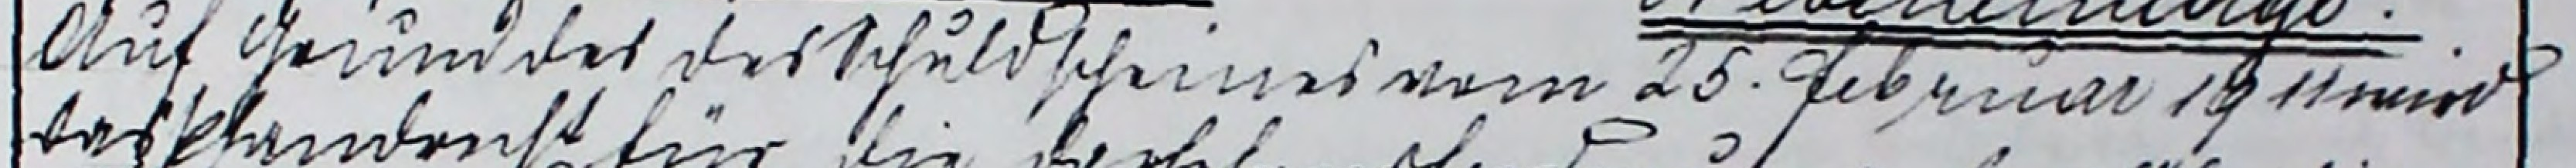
Auf Grund des des Schuldscheines vom 25. Februar 1911 wird
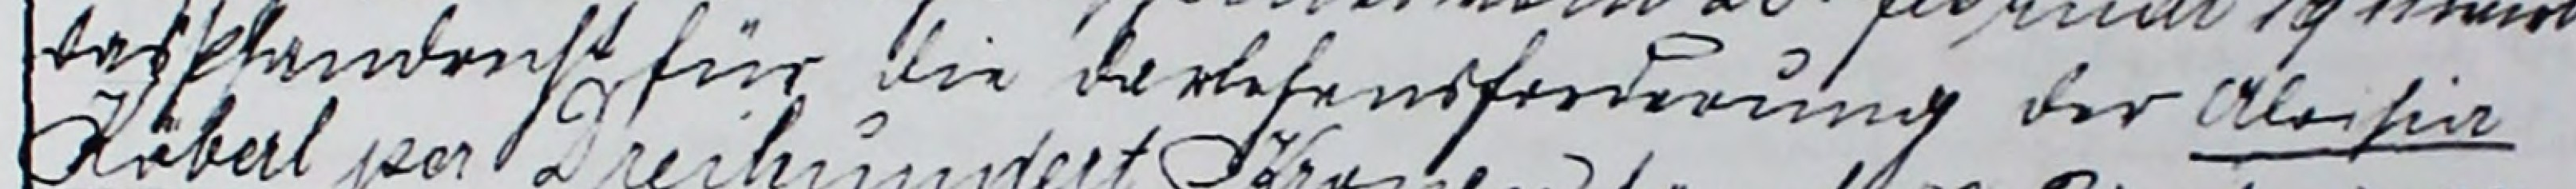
das Pfandrecht für die Darlehensforderung der Aloisia
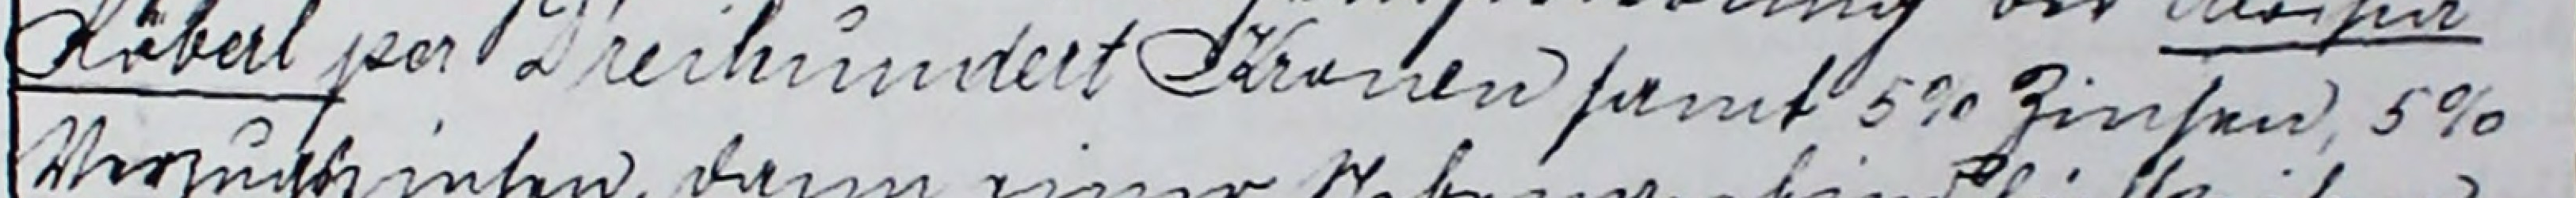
Koberl per Dreihundert Kronen samt 5% zinsen 5%
